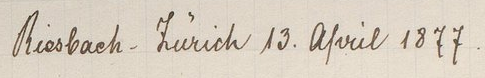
Riesbach–Zürich13. April 1877.
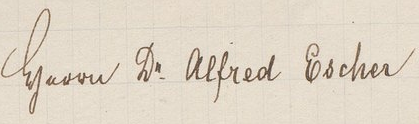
Herrn Dr Alfred Escher
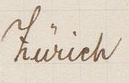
Zürich
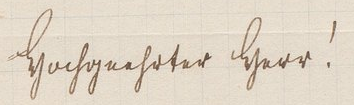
Hochgeehrter Herr!
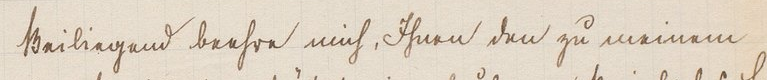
Beiliegend beehre mich, Ihnen den zu meinem
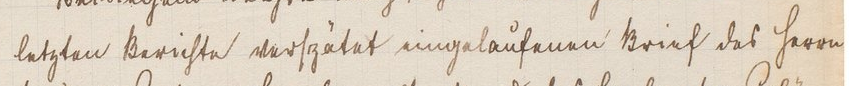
letzten Berichte verspätet eingelaufenen Brief des Herrn
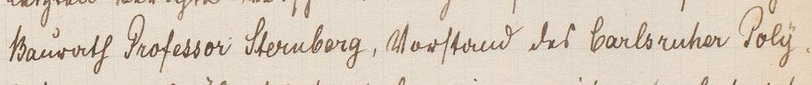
Baurath Professor Sternberg, Vorstand des Carlsruher Poly-
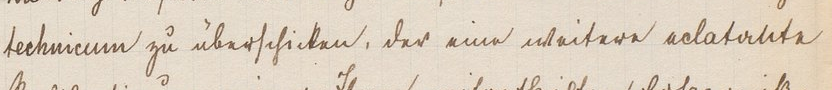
technicum zu überschicken, der eine weitere eclatante
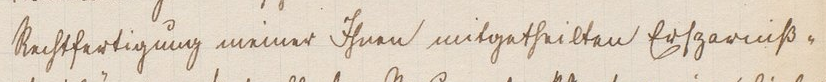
Rechtfertigung meiner Ihnen mitgetheilten Ersparniß-
